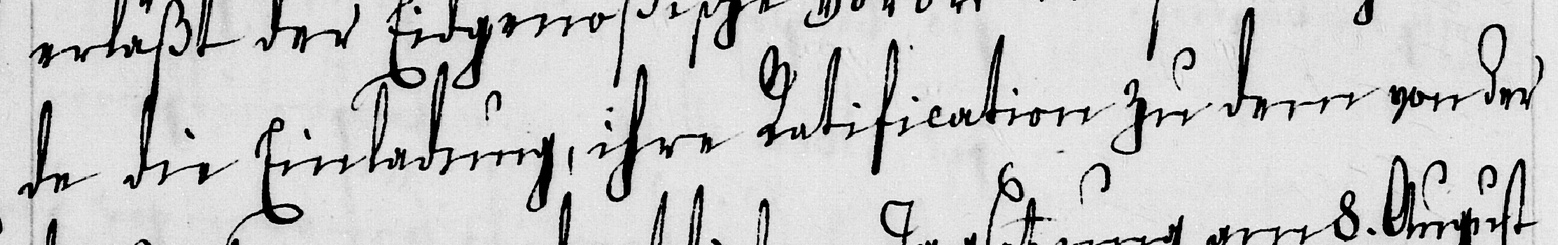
de die Einladung, ihre Ratification zu dem von der
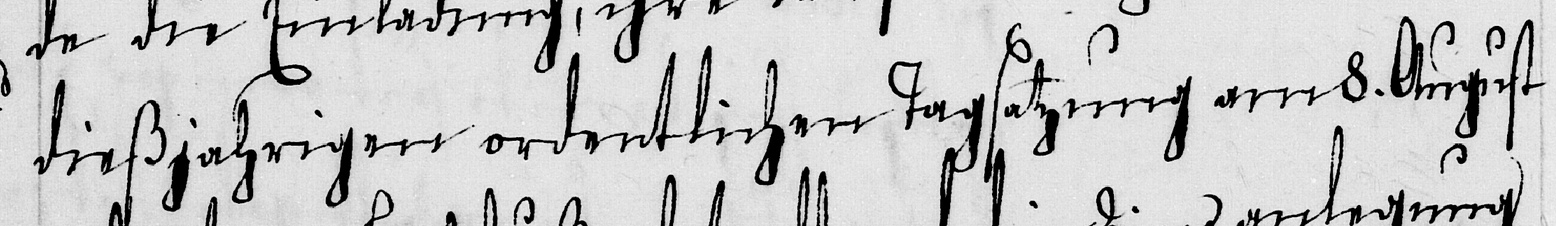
dießjährigen ordentlichen Tagsatzung am 8. August
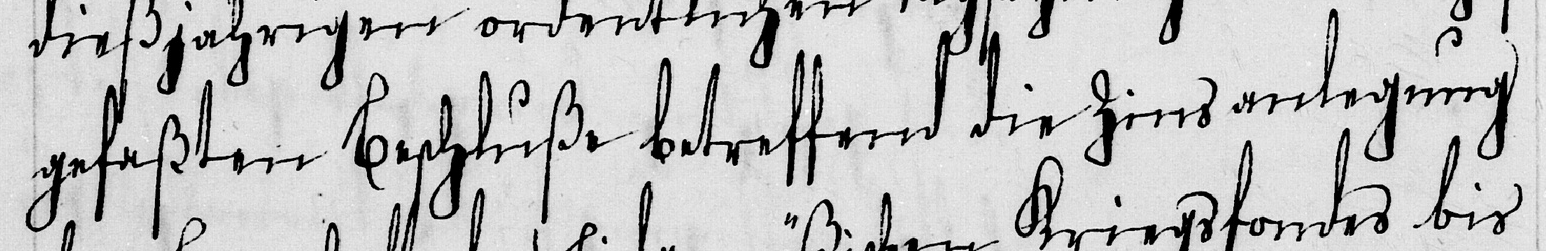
gefaßten Beschluße betreffend die Zinsanlegung
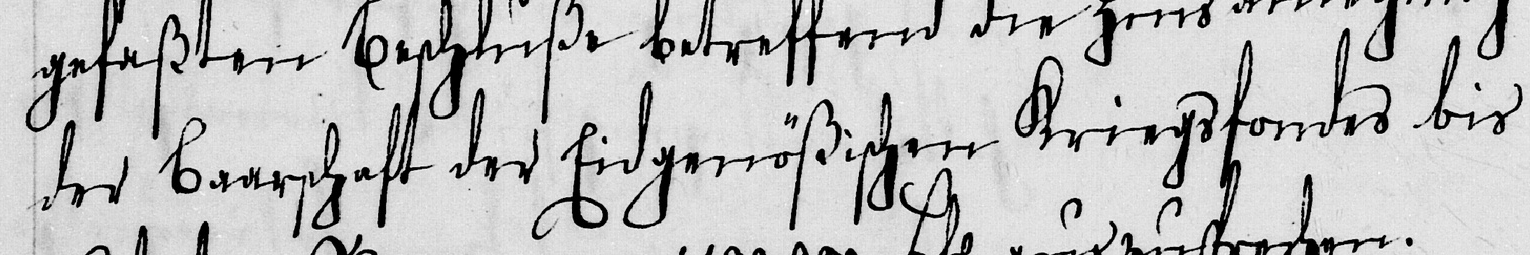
der Baarschaft der Eidgenößischen Kriegsfondes bis
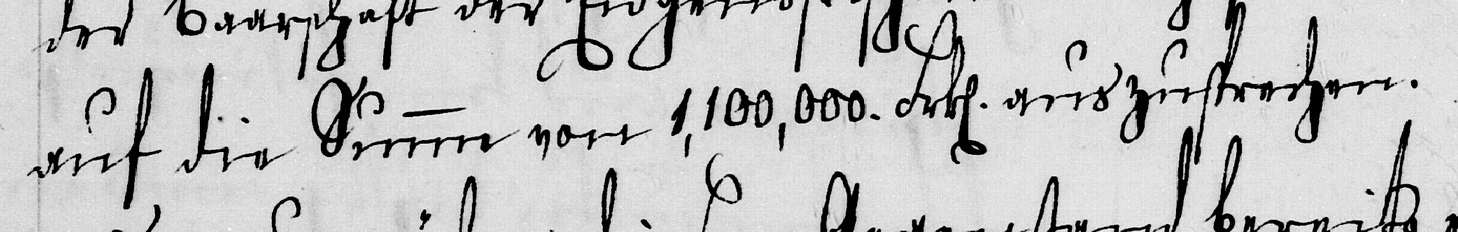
auf die Summe von 1,100,000. Frk[en]. auszusprechen.
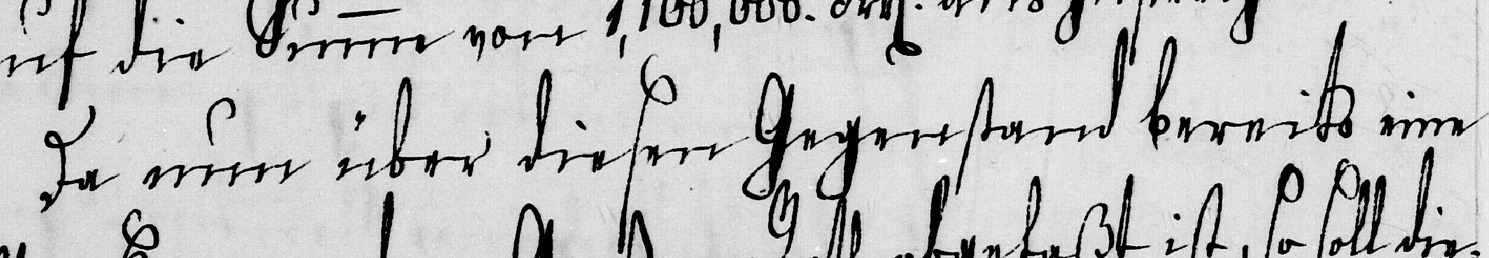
Da nun über diesen Gegenstand bereits eine
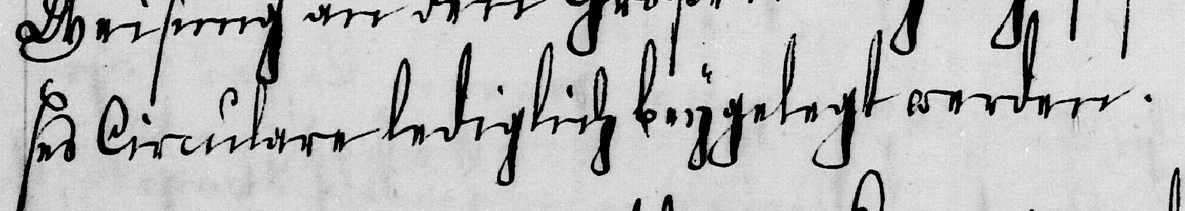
ses Circulare lediglich beygelegt werden.
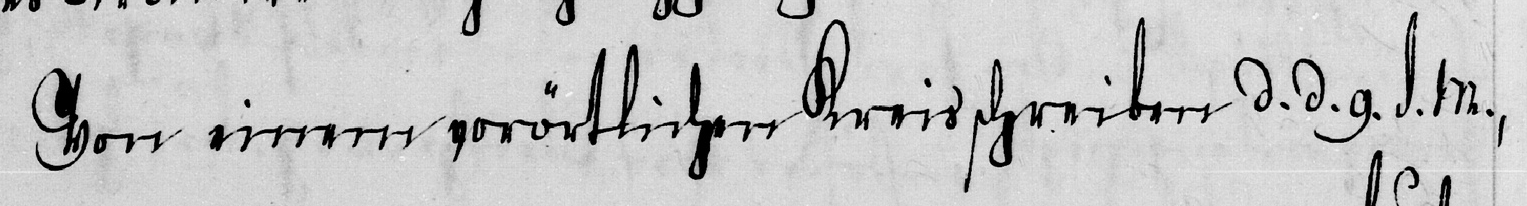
Von einem vorörtlichen Kreisschreiben d. d. 9. d. M.,
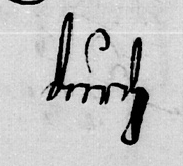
die¬
